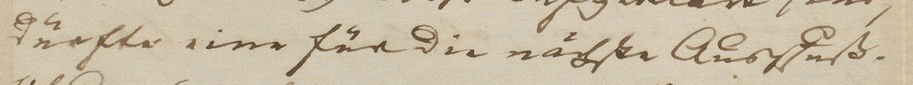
dürfte eine für die nächste Ausschuß-
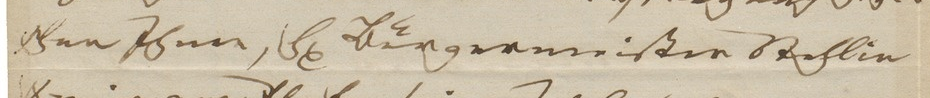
schen Ihnen, Herrn Bürgermeister Stehlin
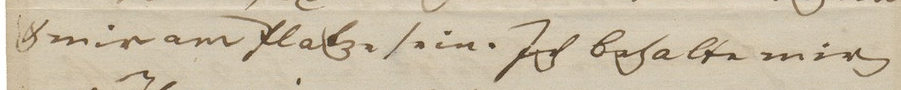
& mir am Platze sein. Ich behalte mir
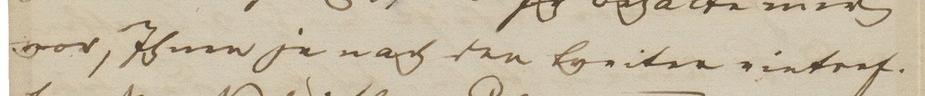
vor, Ihnen je nach den weiter eintref-
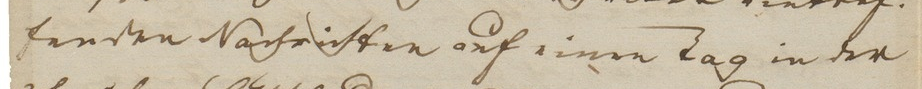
fenden Nachrichten auf einen Tag in der
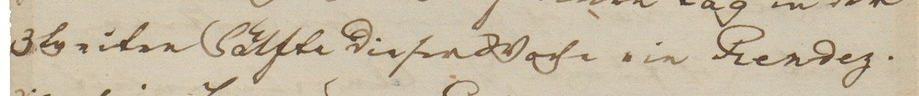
zweiten Hälfte dieser Woche ein Rendez-
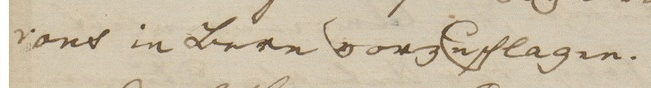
vous in Bern vorzuschlagen.
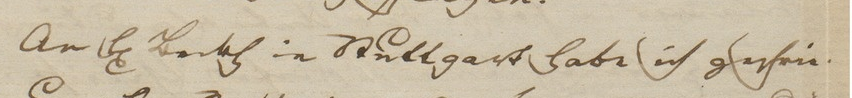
An Herrn Beckh in Stuttgart habe ich geschrie-
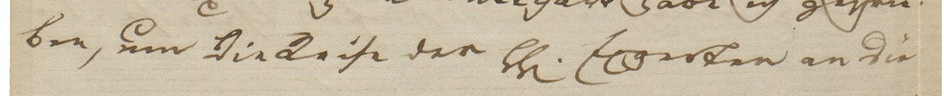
ben, um die Reise der HH. Experten an die
